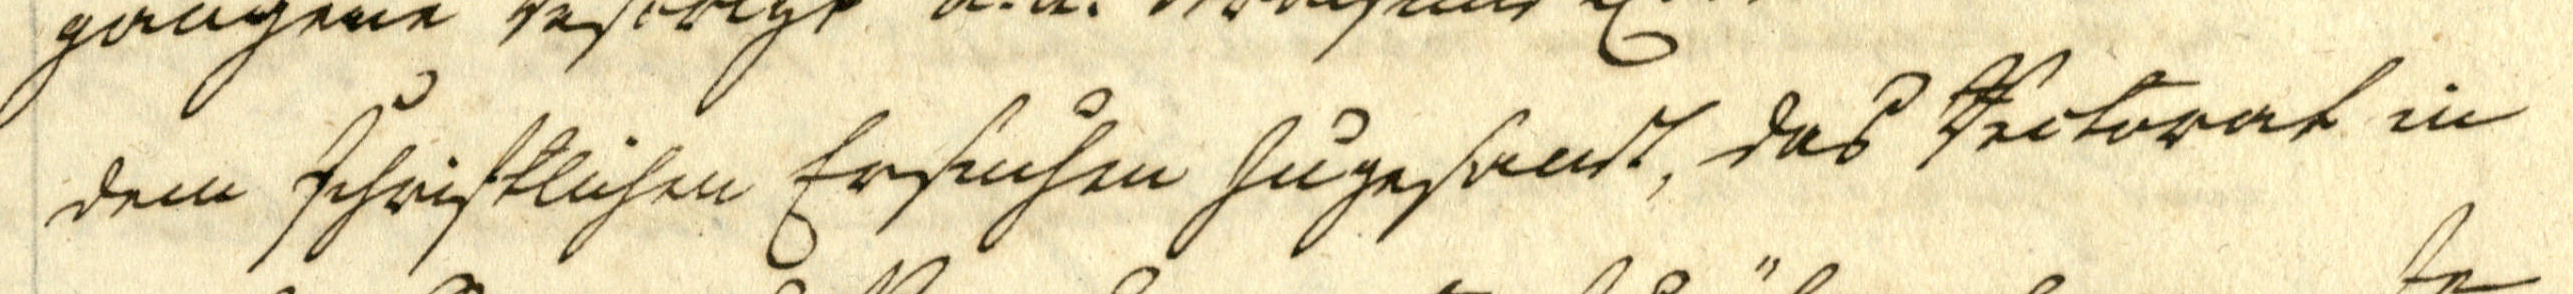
dem schriftlichen Ersuchen zugesandt, das Rectorat in
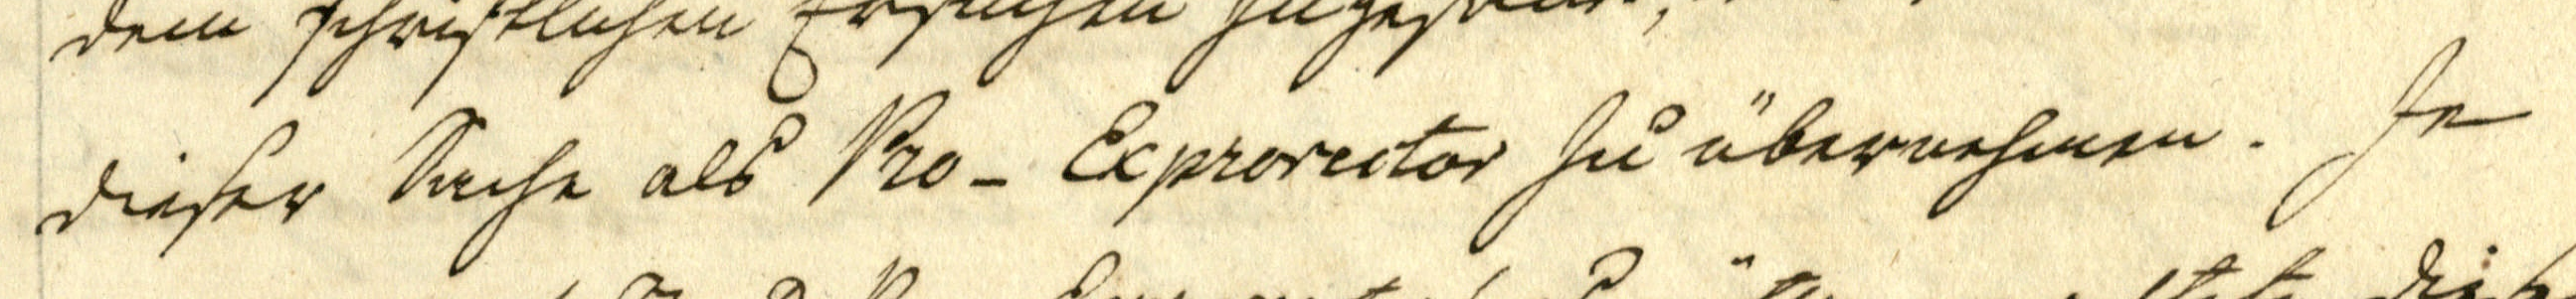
dieser Sache als Pro. Exprorector zu übernehmen. Je
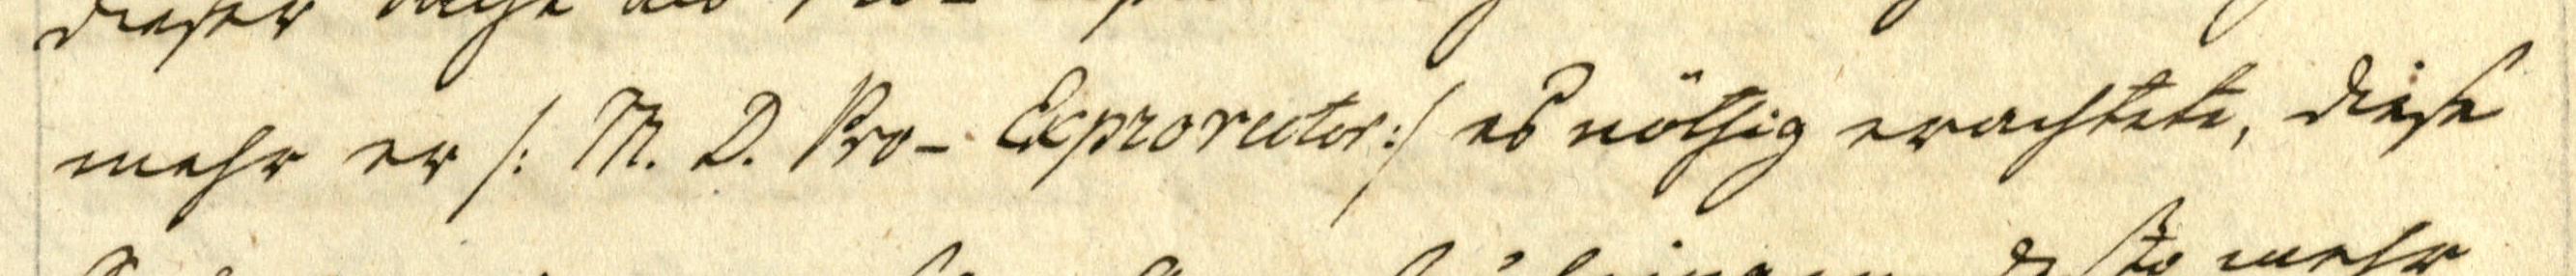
mehr er /: M. D. Pro. Exprorector:/ es nöthig erachtete, diese
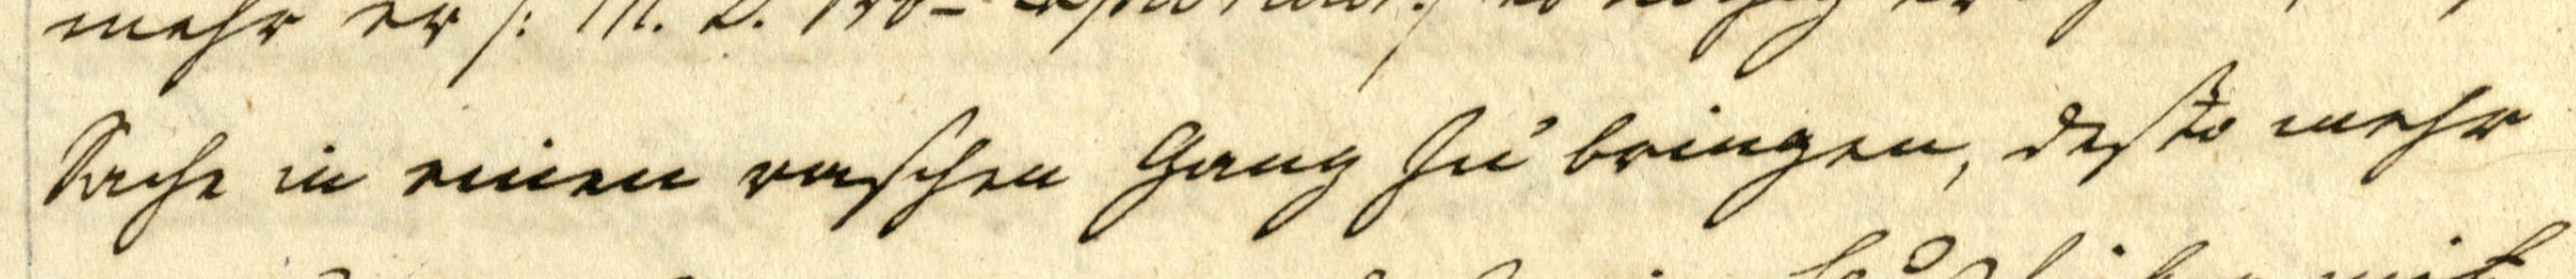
Sache in einen raschen Gang zu bringen, desto mehr
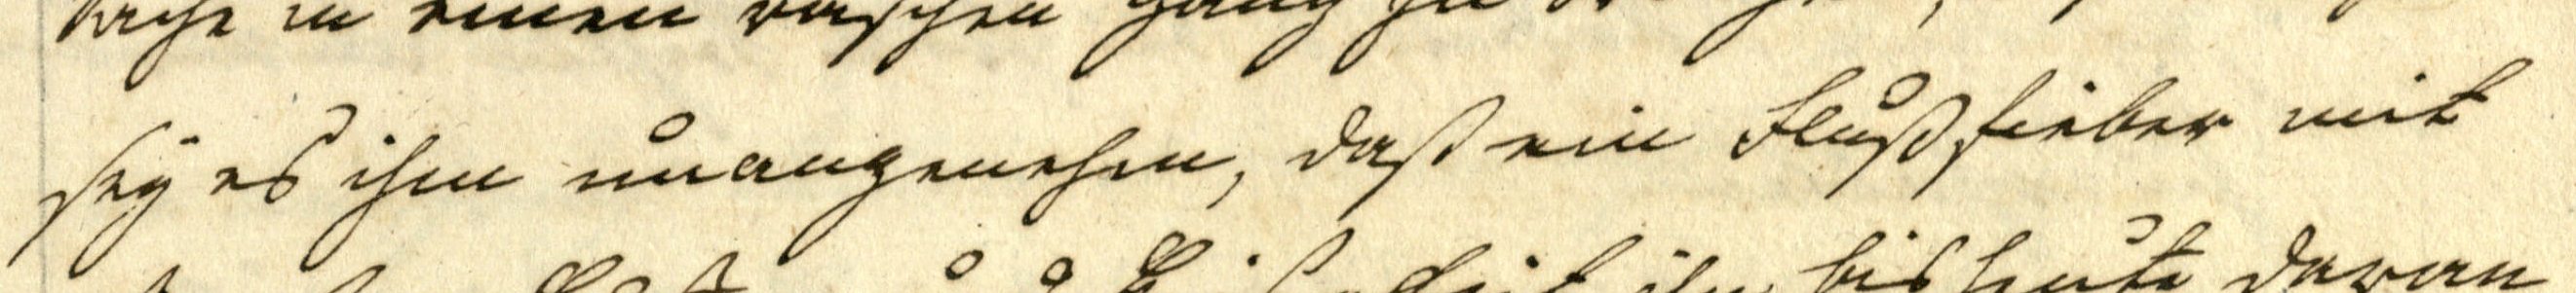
seÿ es ihm unangenehm, daß ein Flußfieber mit
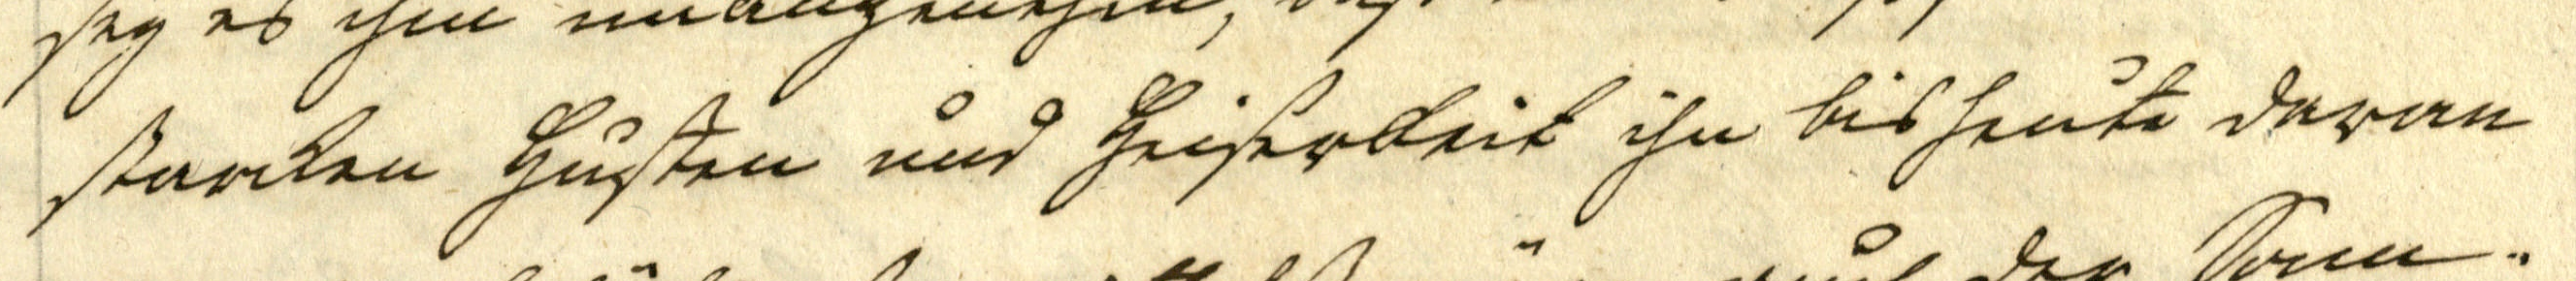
starcken Husten und Heiserkeit ihn bis heute daran
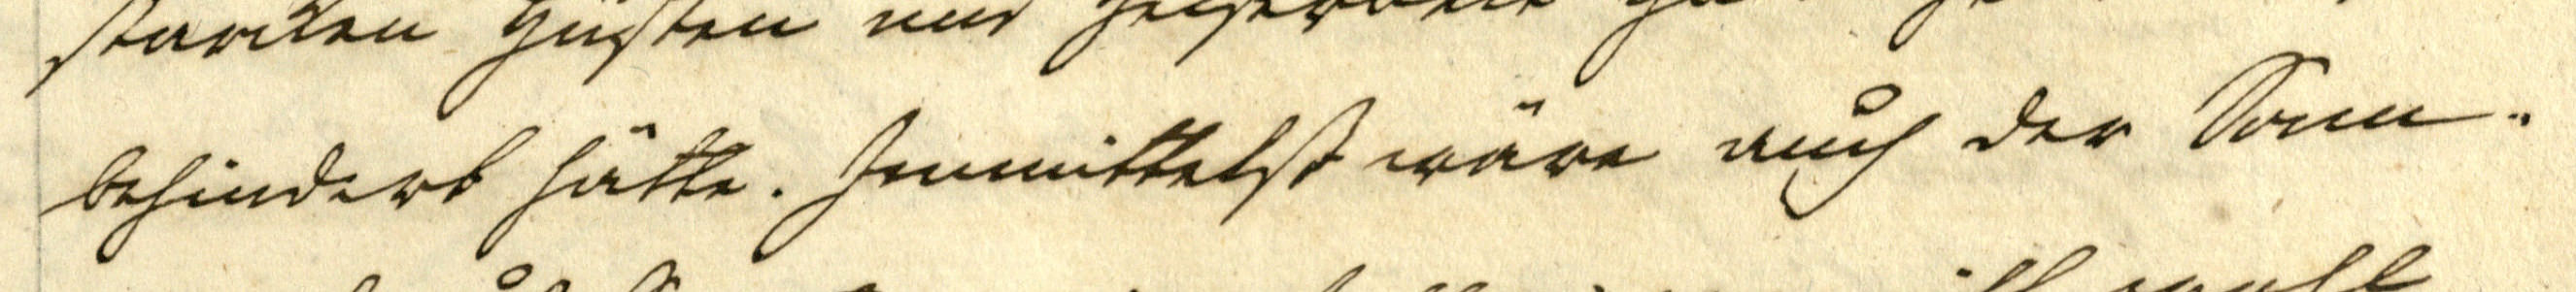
behindert hätte. Immittelst wäre auch der Sonn¬
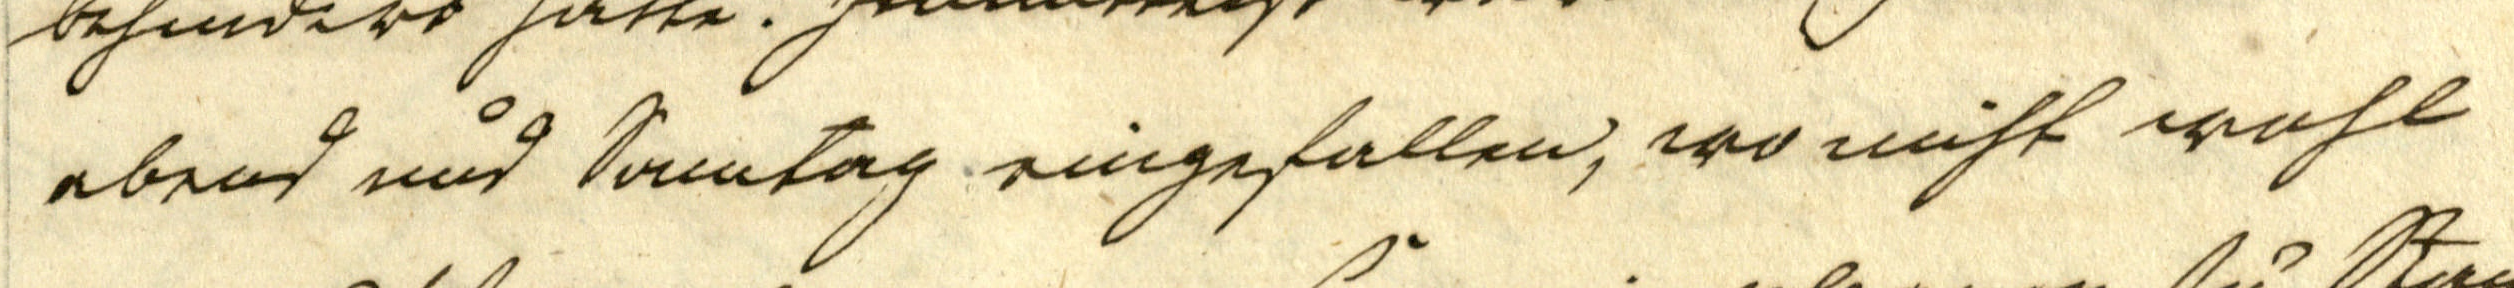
abend und Sonntag eingefallen, wo nicht wohl
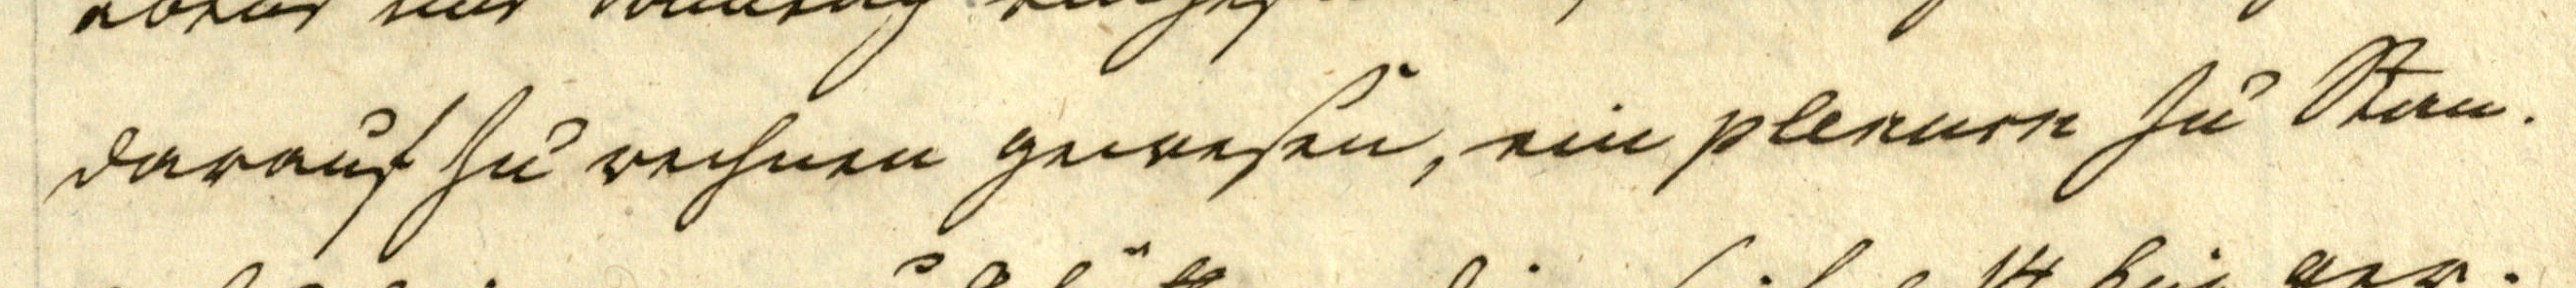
darauf zu rechnen gewesen, ein plenum zu Stan¬
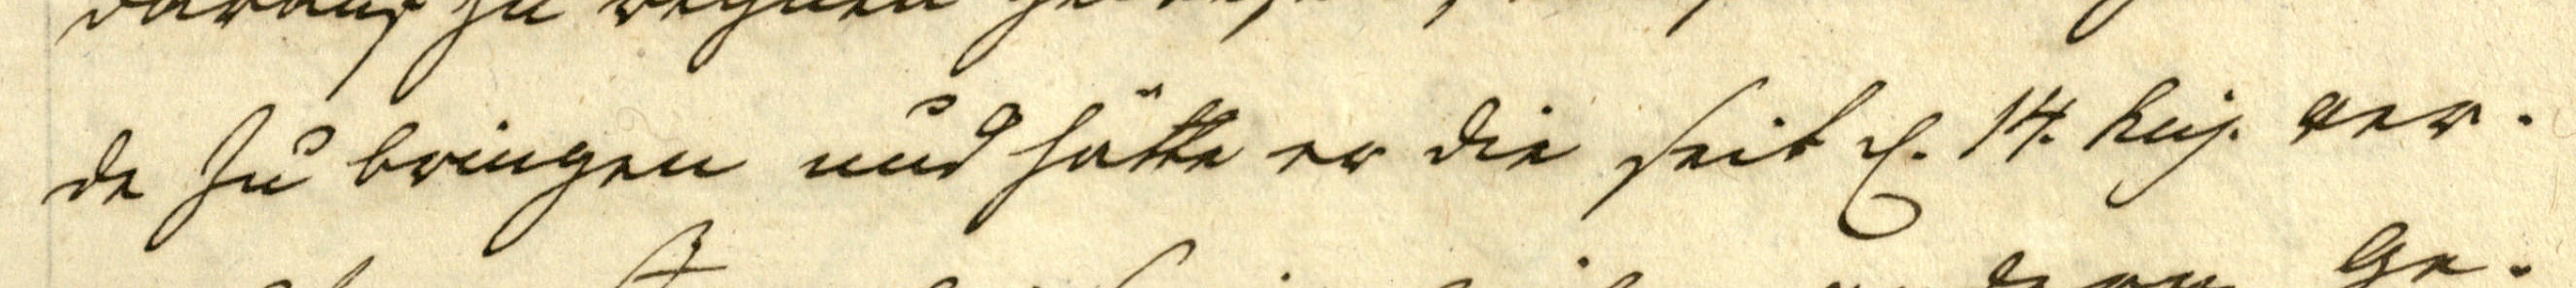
de zu bringen und hätte er die seit l. 14 huj. ver¬
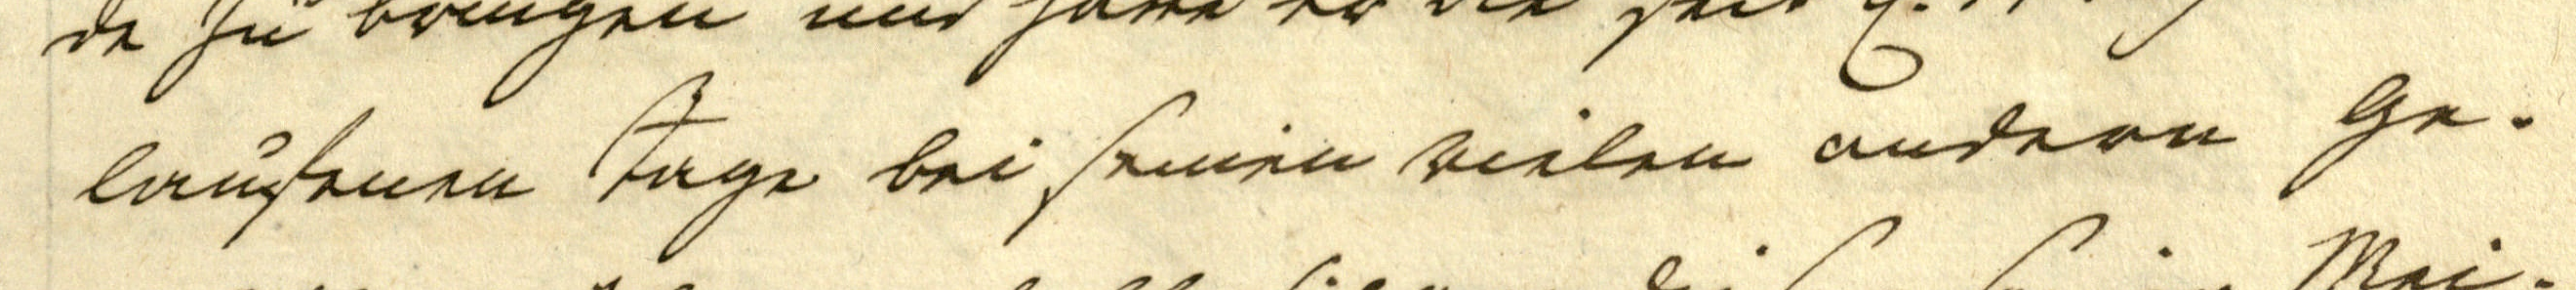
laufenen Tage bei seinen vielen andern Ge¬
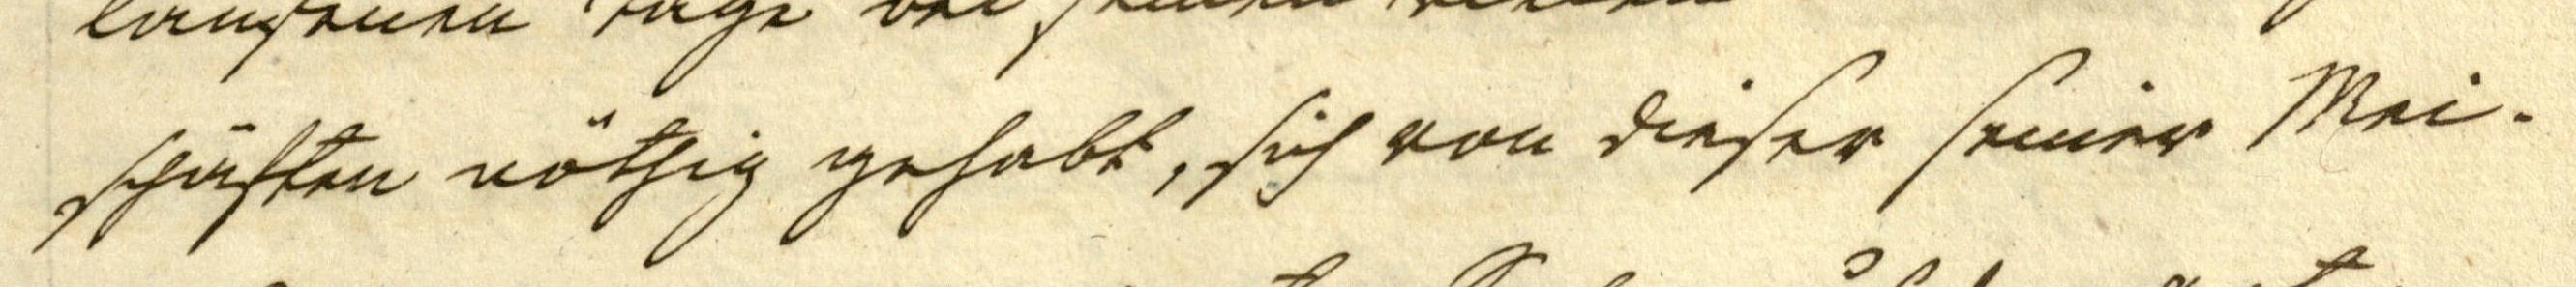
schäften nöthig gehabt, sich von dieser seiner Mei¬
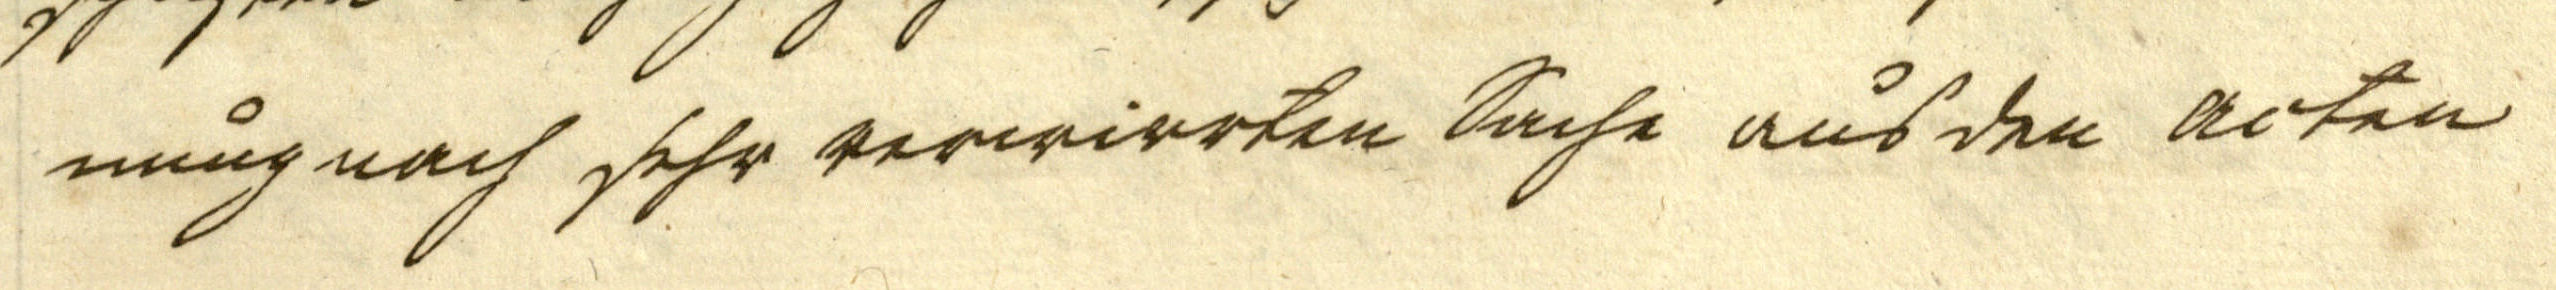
nung nach sehr verwirrten Sache aus den Acten
